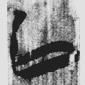㠯（以）
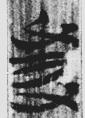尃（博）
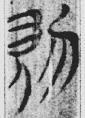則
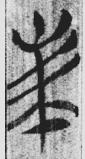民
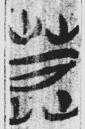莫
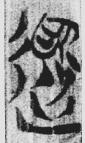○（遺）
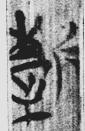新（新）
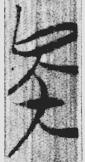矣
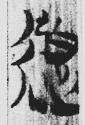道（導）
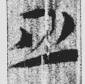之
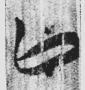㠯（以）
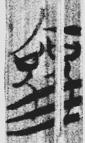𡑯（儉）
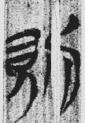則
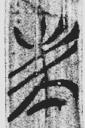民
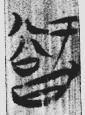智（知）
